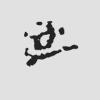皿
